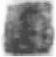輪
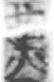黃
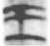王
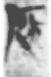所
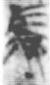馭（御）
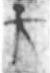大
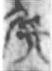○（殿）
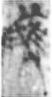雘
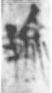輪
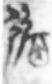弼
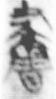○（畫）
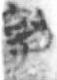韌
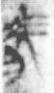○（虎）
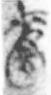○（韔）
